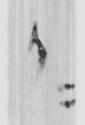人
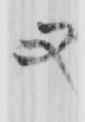又
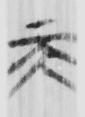天
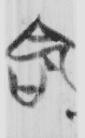命
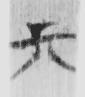亓
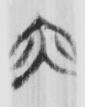亦
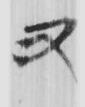又
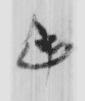身
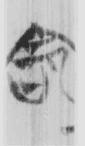命
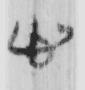心
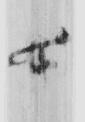氒
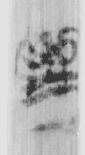爲
